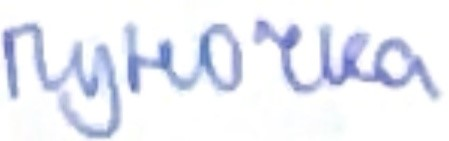пуночка
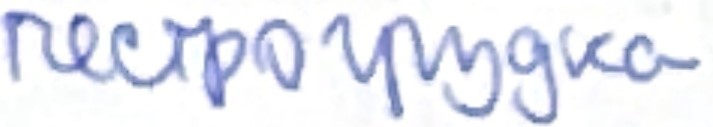пестрогрудка
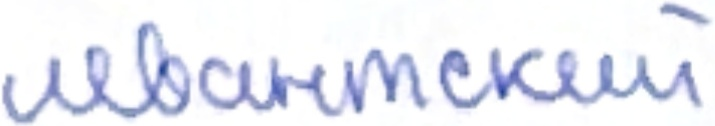левантский
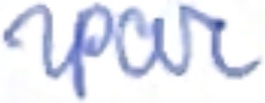грач
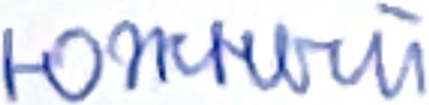южный
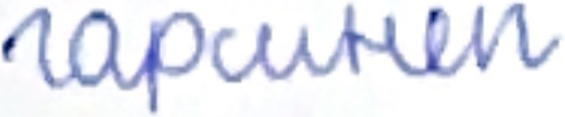гаршнеп
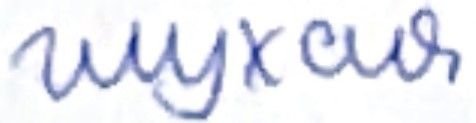глухая
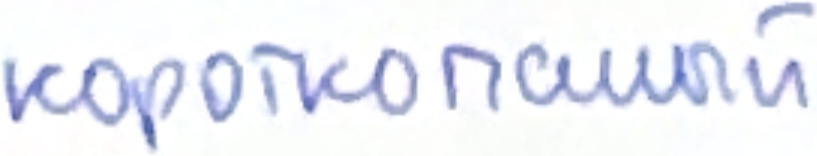короткопалый
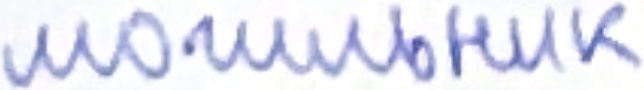могильник
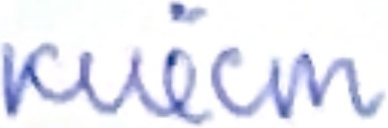клёст
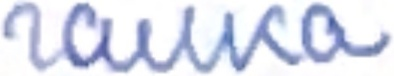галка
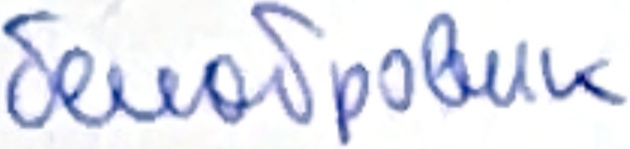белобровик
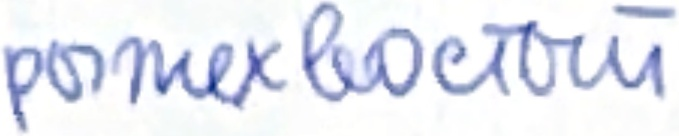рыжехвостый
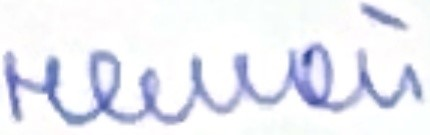немой
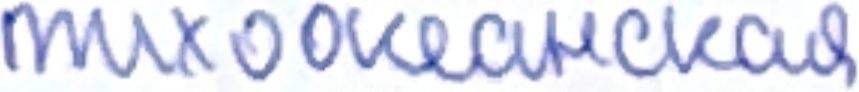тихоокеанская
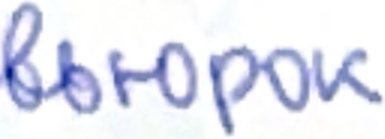вьюрок
